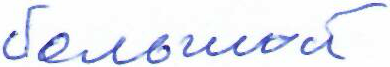большой
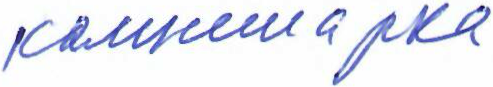камнешарка
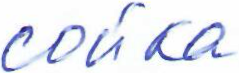сойка
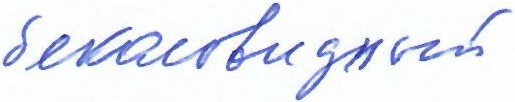бекасовидный
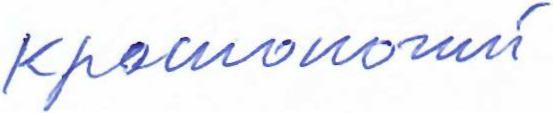кросноногий
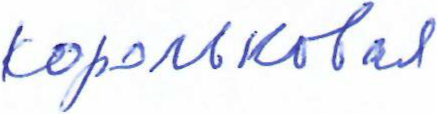корольковая
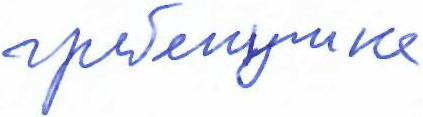гребенушка
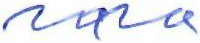гага
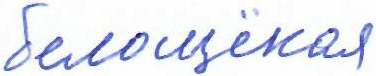белощёкая
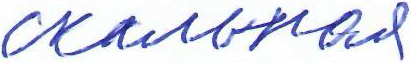скальная
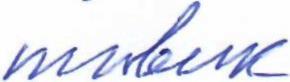тювик
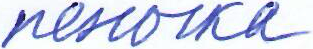пеночка
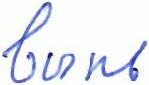выпь
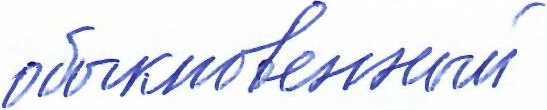обыкновенный
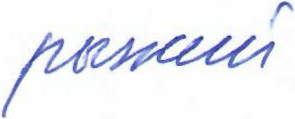рыжий
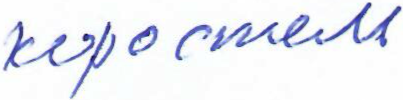коростель
